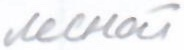лесной
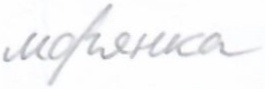морянка
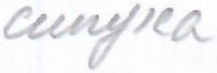сипуха
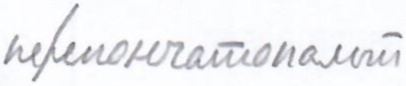перепончатопалый
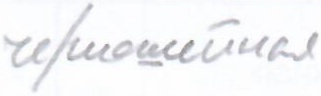черношейная
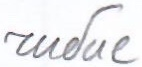чибис
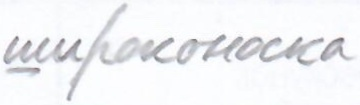широконоска
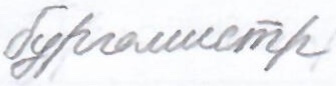бургомистр
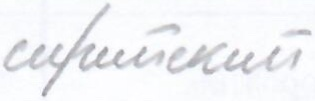сирийский
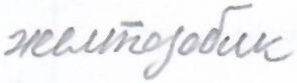желтозобик
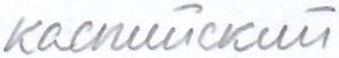каспийский
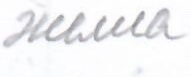желна
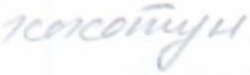хохотун
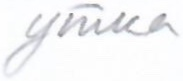утка
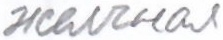желчная
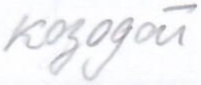козодой
